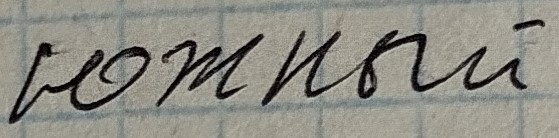южный
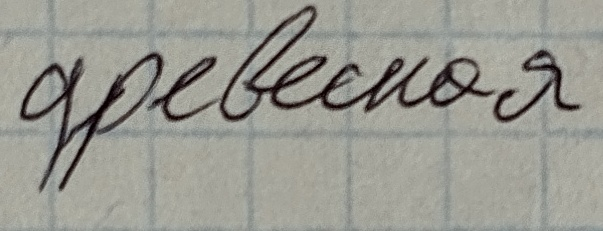древесная
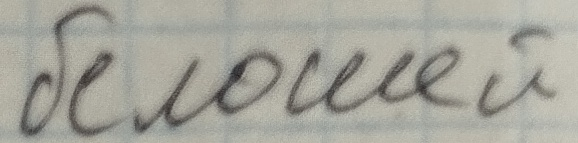белошей
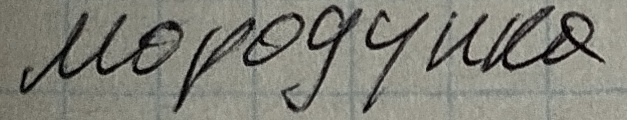мородунка
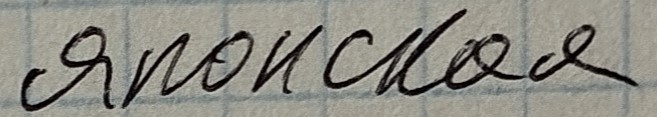японская
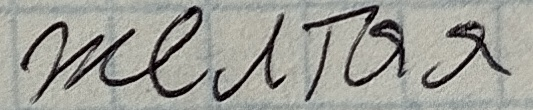желтая
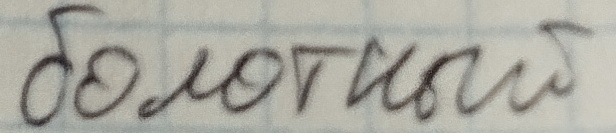болотный
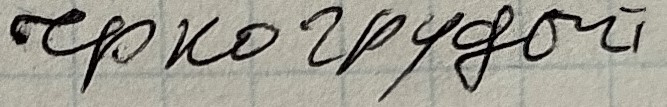чрногрудый
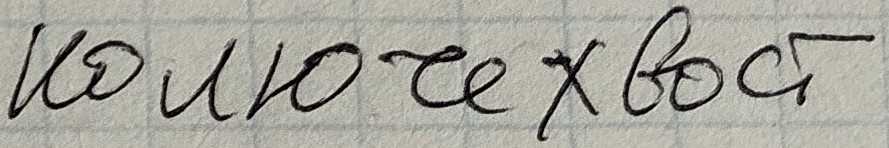колючехвост
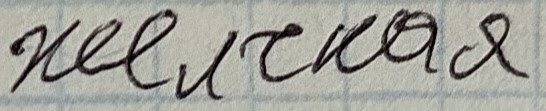желчная
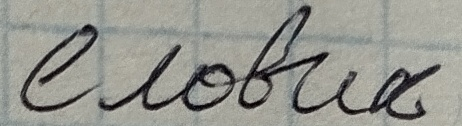еловик
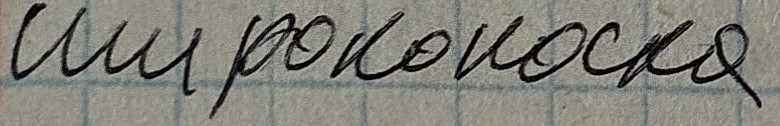широконоска
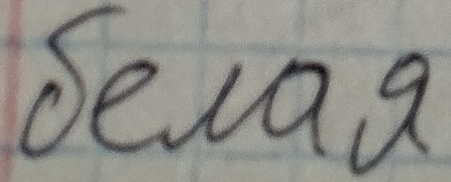белая
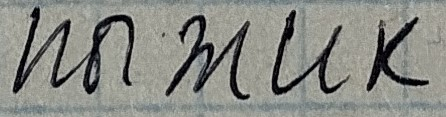пыжик
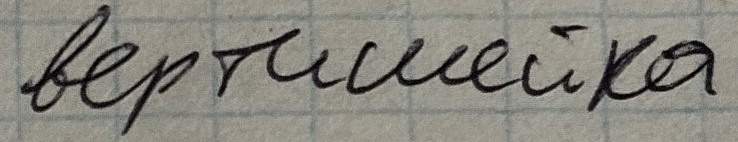вертишейка
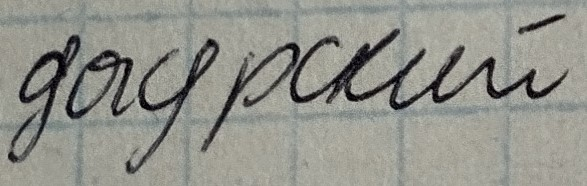даурский
